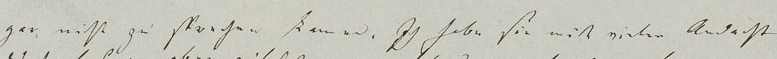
gar nicht zu sprechen kamen. Ich habe sie mit vieler Andacht
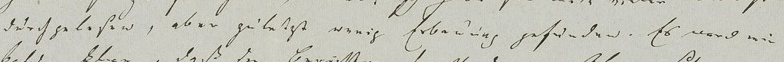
durchgelesen, aber zuletzt wenig Erbauung gefunden. Es ward mir
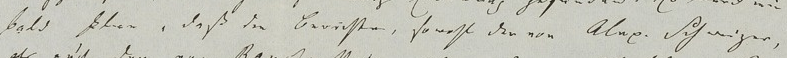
bald klar, dass die Berichte, sowohl der von Alex. Schweizer,
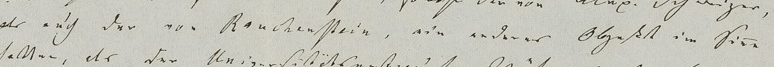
als auch der von Rauchenstein, ein anderes Objekt im Sinne
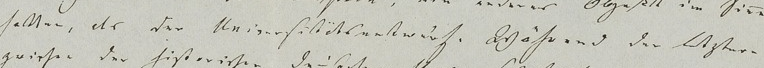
hatten, als der Universitätsentwurf. Während der letztere
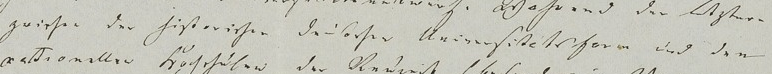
zwischen der historischen deutschen Universitätsform und den
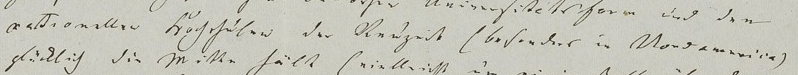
rationellen Hochschulen der Neuzeit (besonders in Nordamerica)
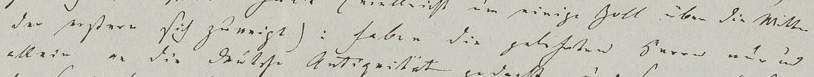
der erstern sich zuneigt): haben die gelehrten Herrn nur und
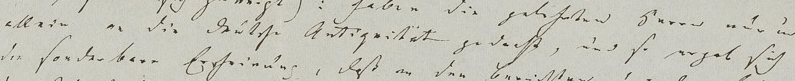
allein an die deutsche Antiquität gedacht, und so ergab sich
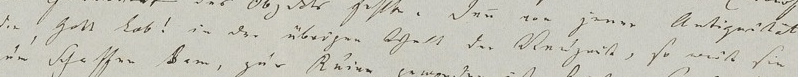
die, Gott Lob! in der übrigen Welt der Neuzeit, so weit sie
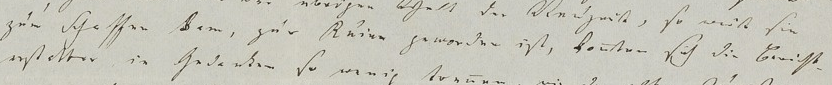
zum Schaffen kam, zur Ruine geworden ist, konnten sich die Bericht-
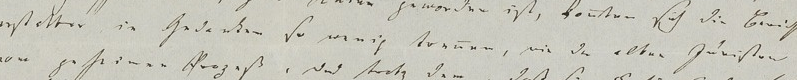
erstatter in Gedanken so wenig trennen, wie die alten Juristen
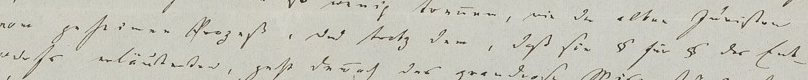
vom geheimen Prozeß, und trotz dem, daß sie § für § des Ent-
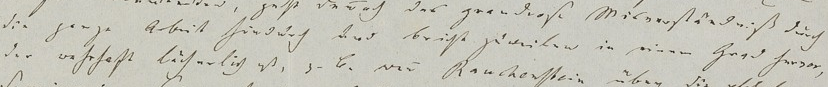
die ganze Arbeit hindurch und bricht zuweilen in einem Grad hervor,
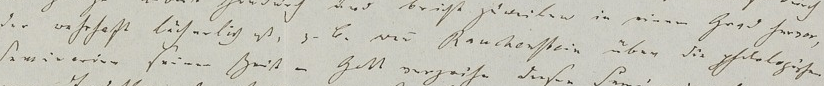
der wahrhaft lächerlich ist, z. B. wenn Rauchenstein über die philologischen
